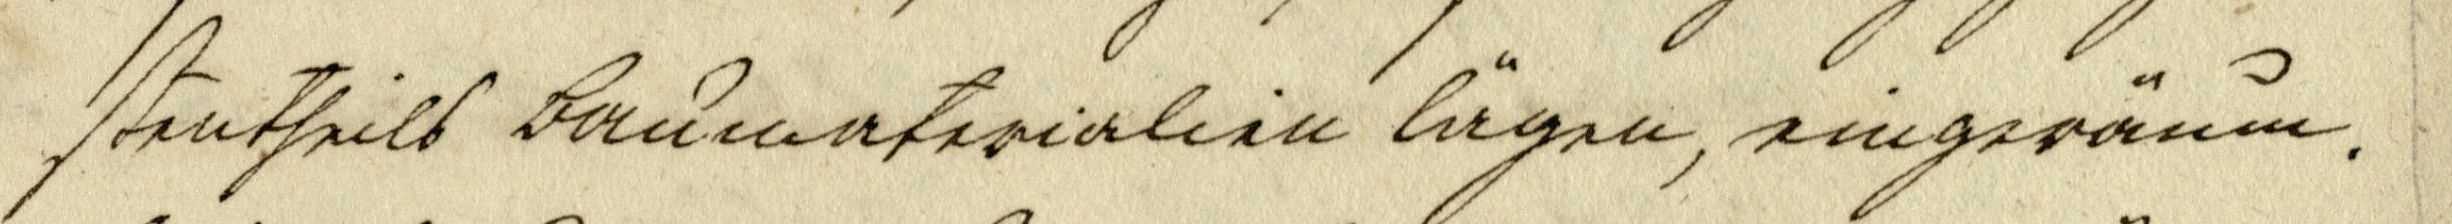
stentheils Baumaterialien lägen, eingeräum¬
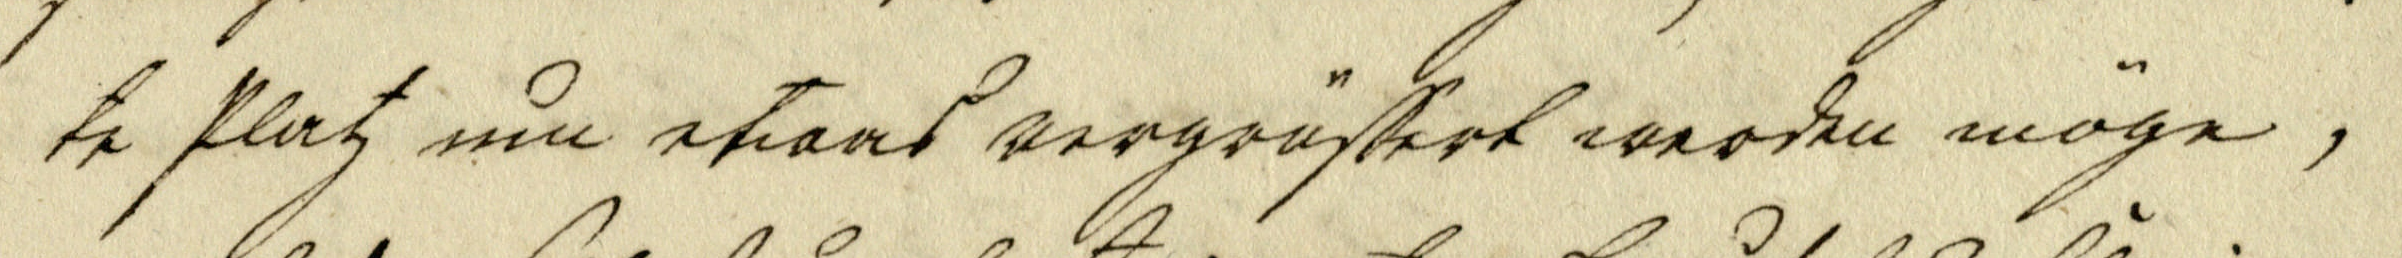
te Platz um etwas vergrössert werden möge,
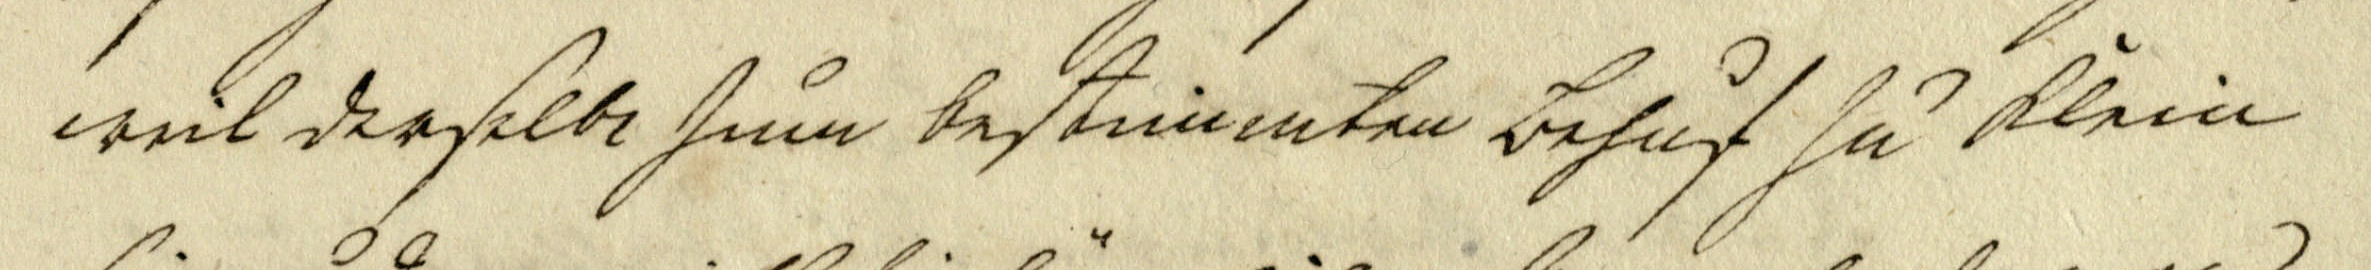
weil derselbe zum bestimmten Behuf zu klein
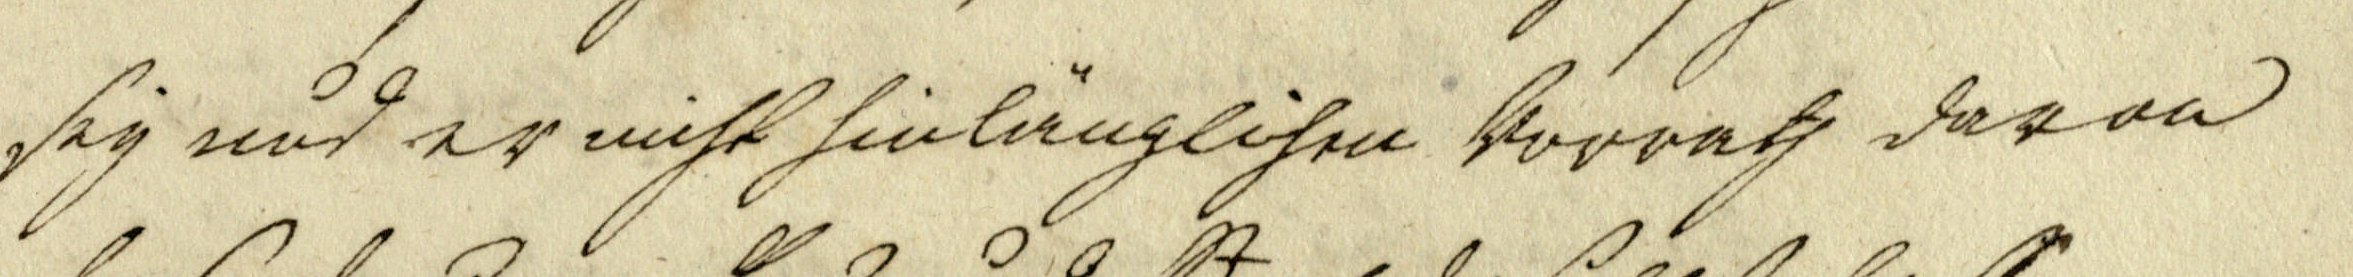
seÿ und er nicht hinlänglichen Vorrath davon
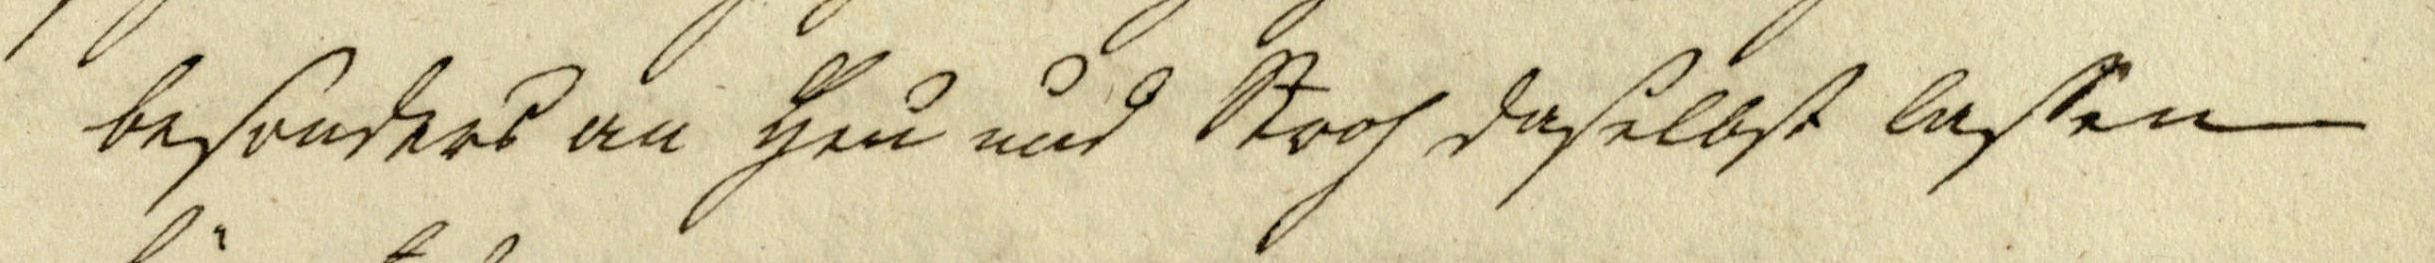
besonders an Heu und Stroh daselbst lassen
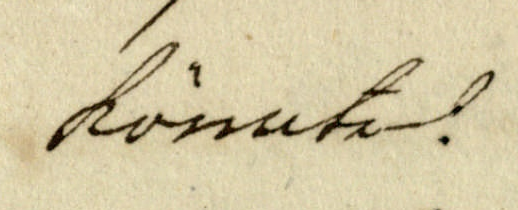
könnte.
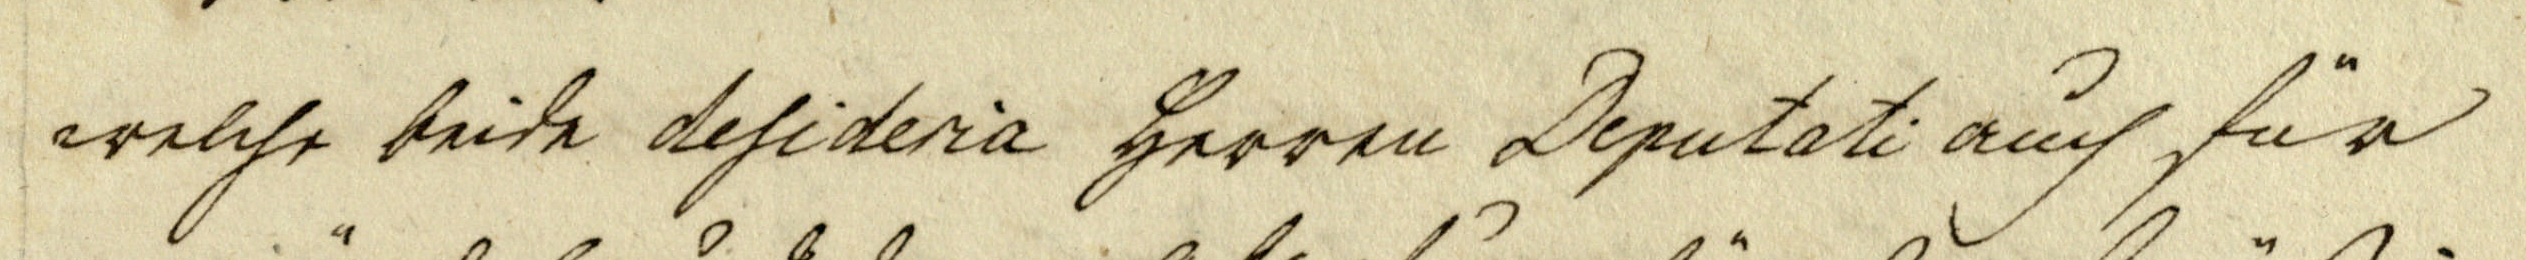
welche beide desideria Herren Deputati auch für
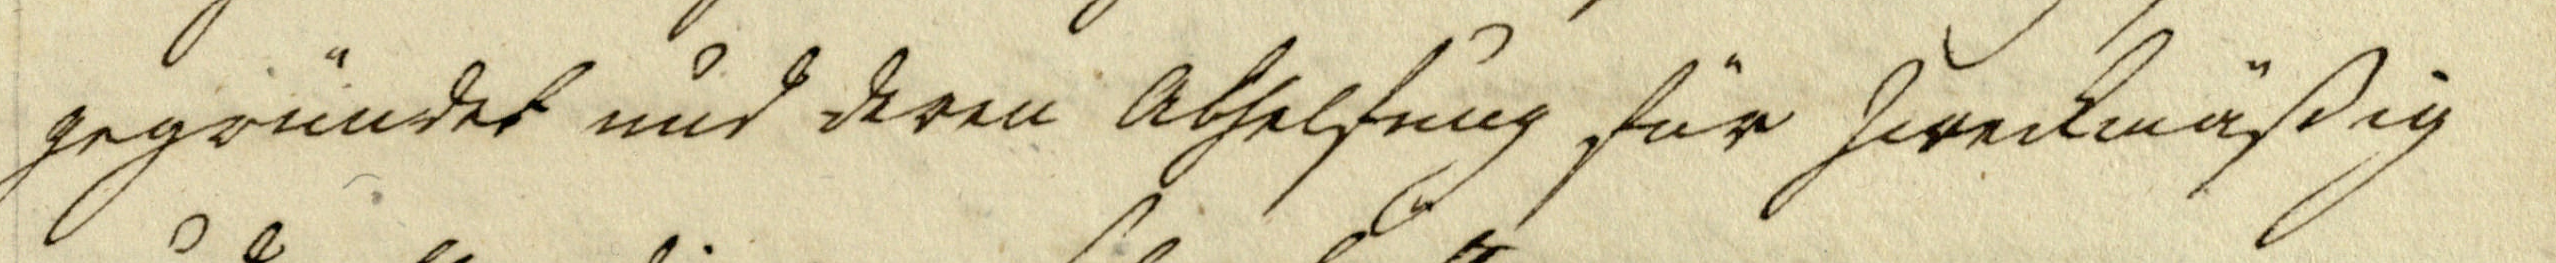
gegründet und deren Abhelfung für zweckmäßig
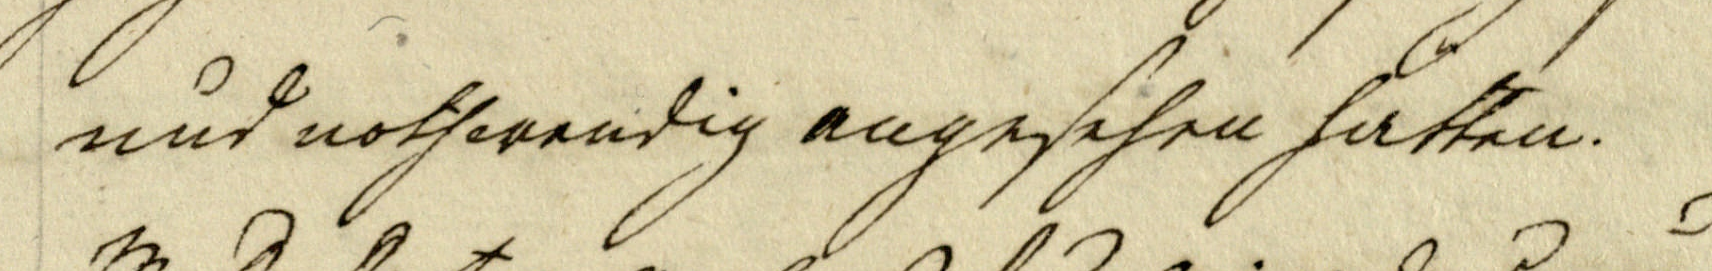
und nothwendig angesehen hätten.
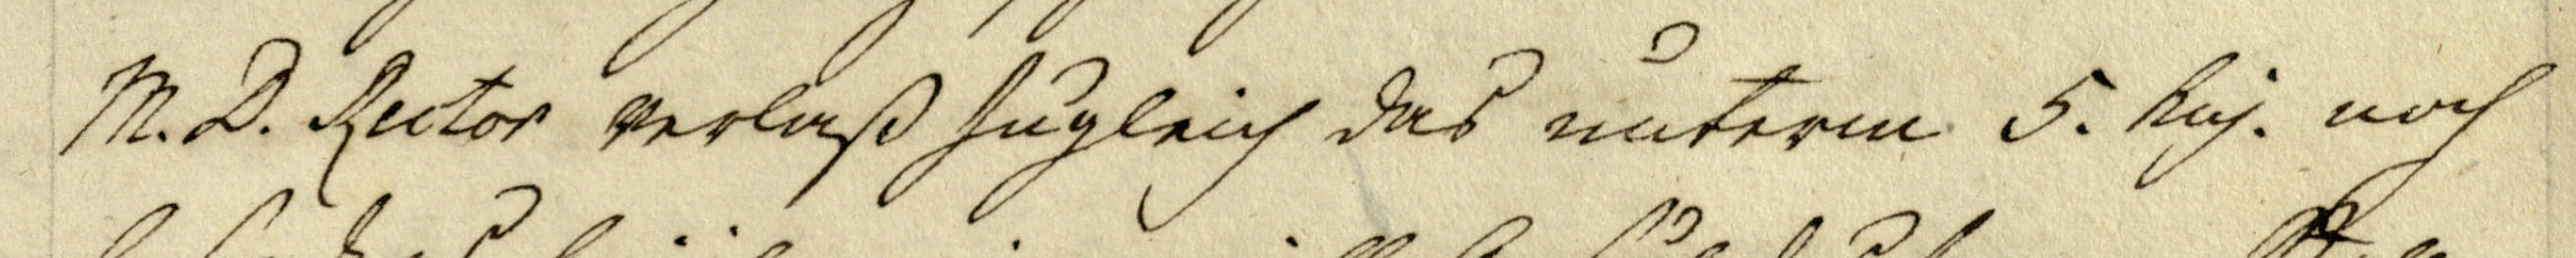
M. D. Rector verlaß zugleich das unterm 5. huj. noch
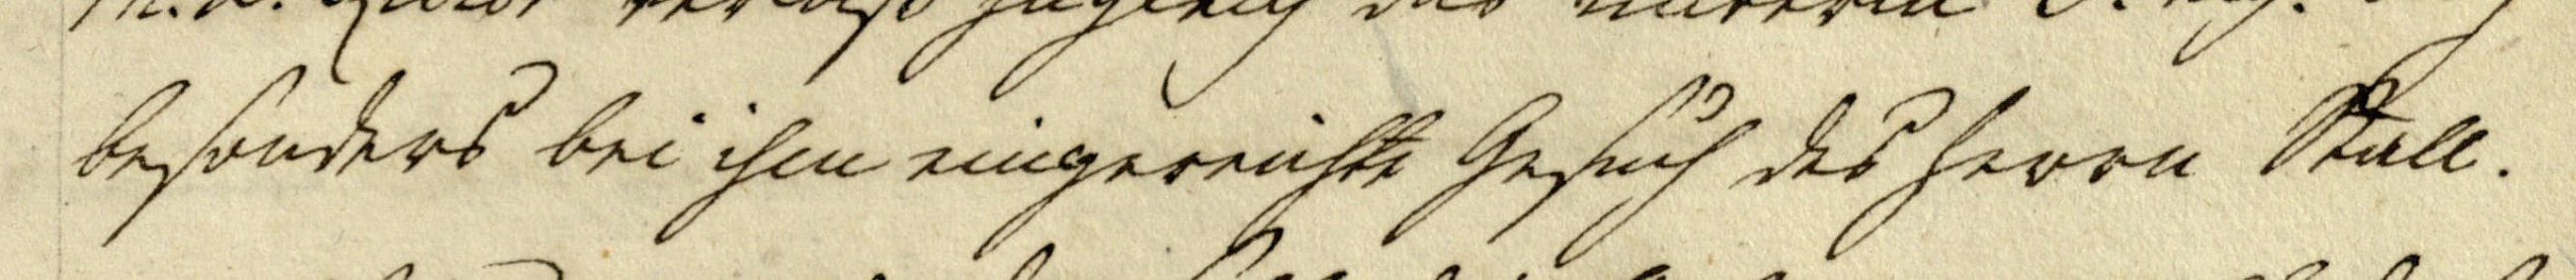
besonders bei ihm eingereichte Gesuch des Herrn Stall¬
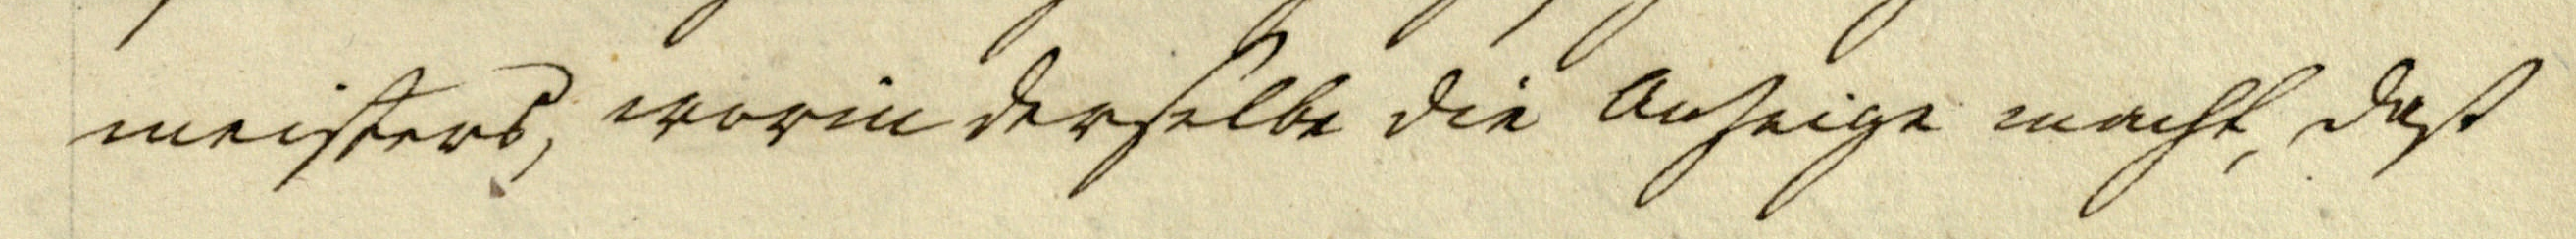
meisters, worin derselbe die Anzeige macht, daß
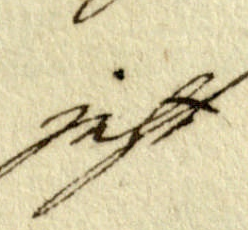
jetzt
